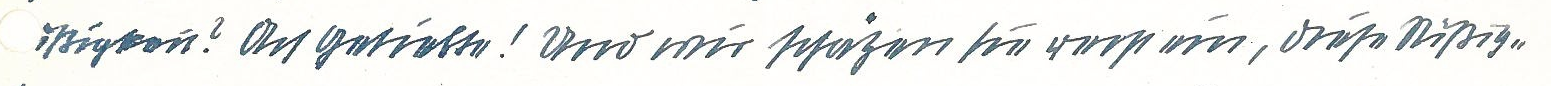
ßigkeit? Ach Geliebte! Und wir schätzen sie erst ein, diese Süßig¬
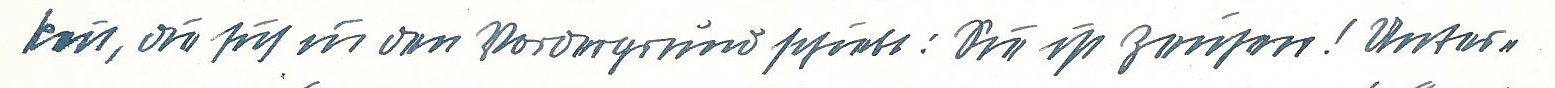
keit, die sich in den Vordergrund schiebt: Sie ist Zeichen! Unter¬
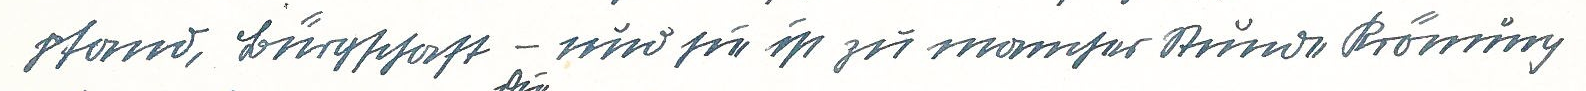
pfand, Bürgschaft – und sie ist zu mancher Stunde Krönung
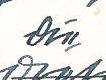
die
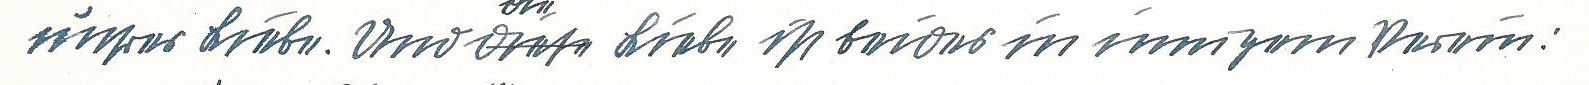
unsrer Liebe. Und diese Liebe ist beides in innigem Verein:
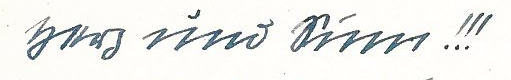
Herz und Sinn!!!
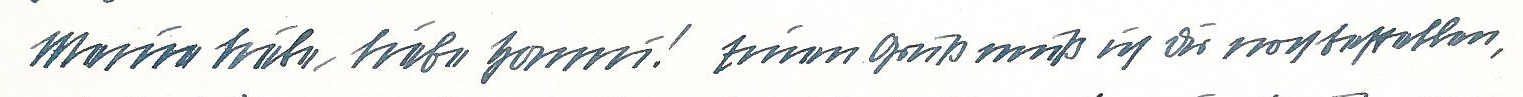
Meine liebe, liebe! Einen Gruß muß ich Dir noch bestellen,
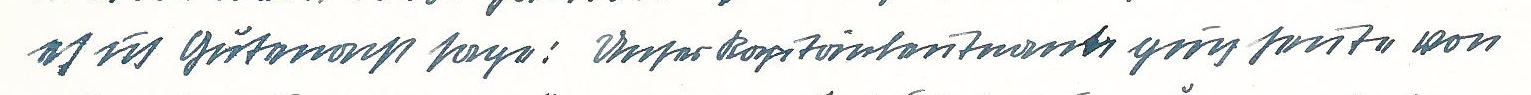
eh ich Gutenacht sage: Unser Kompanieleutnant ging heute von
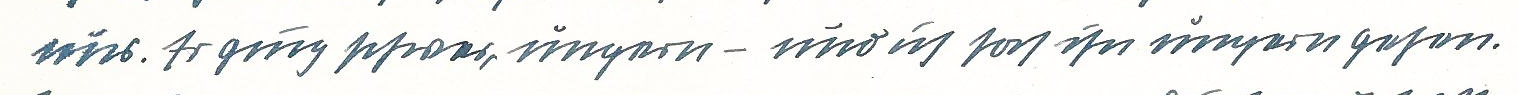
uns. Er ging schwer, ungern – und ich sah ihn ungern gehen.
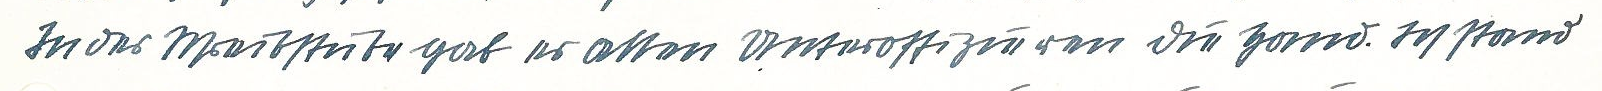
In der Schreibstube gab er allen Unteroffizieren die Hand. Ich stand
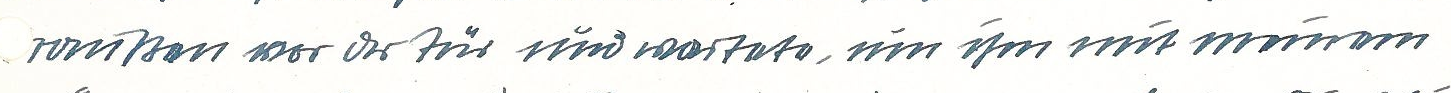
raußen vor der Tür und wartete, um ihm mit meinem
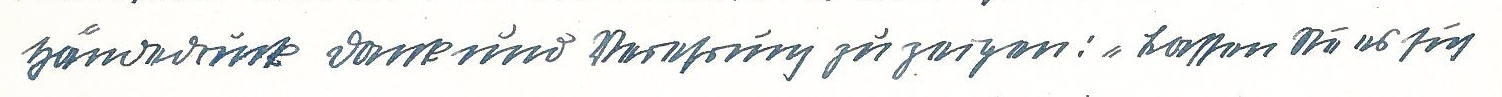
Händedruck Dank und Verehrung zu zeigen: „Lassen Sie es sich
